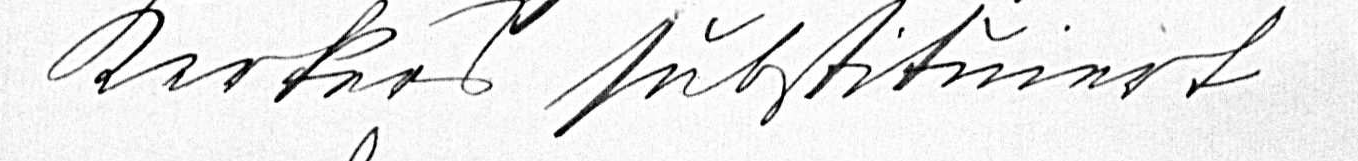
Kerkers substituiert
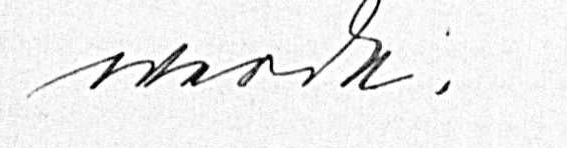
werde.
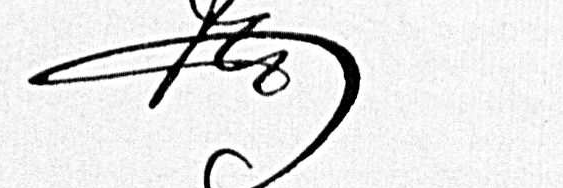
xx
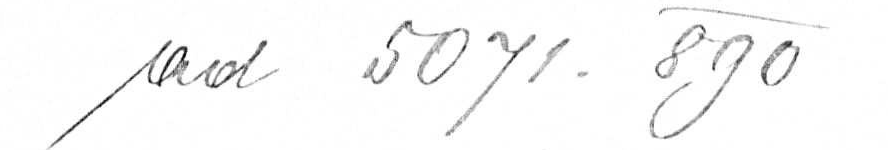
ad 5071. 890
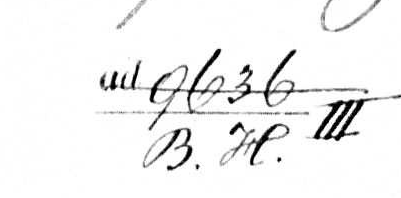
ad 9636 III
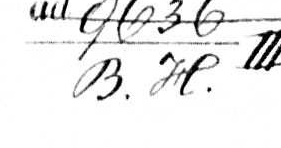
B. H.
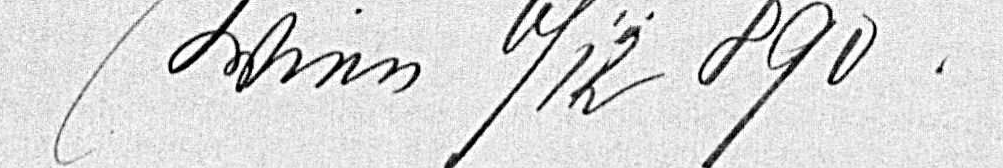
Wien 6/12 890.
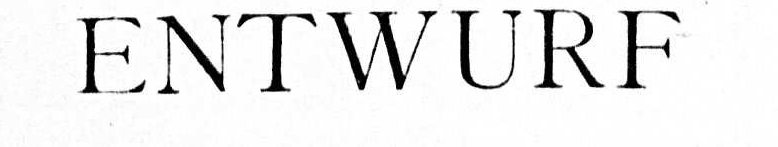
Entwurf
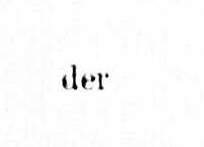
der
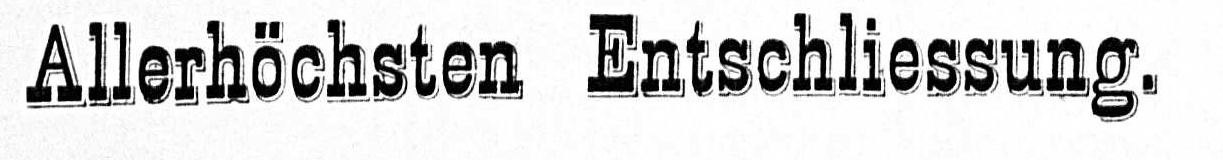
Allerhöchsten Entschliessung.
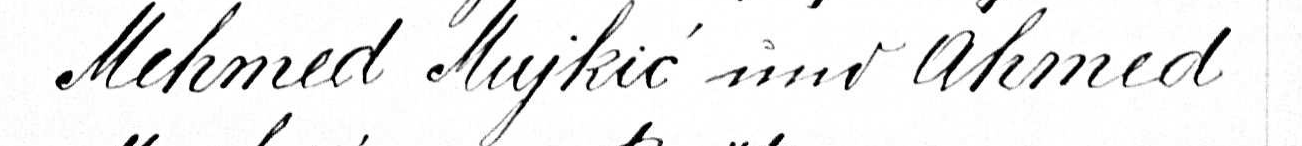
Mehmed Mujkić und Ahmed
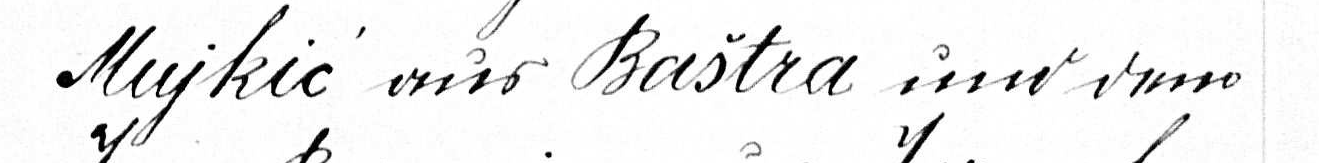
Mujkić aus Bastra und dem
